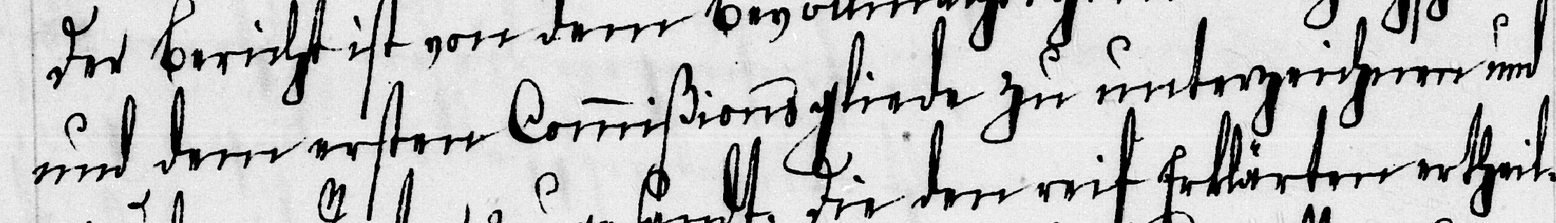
und dem ersten Commißionsgliede zu unterzeichnen und
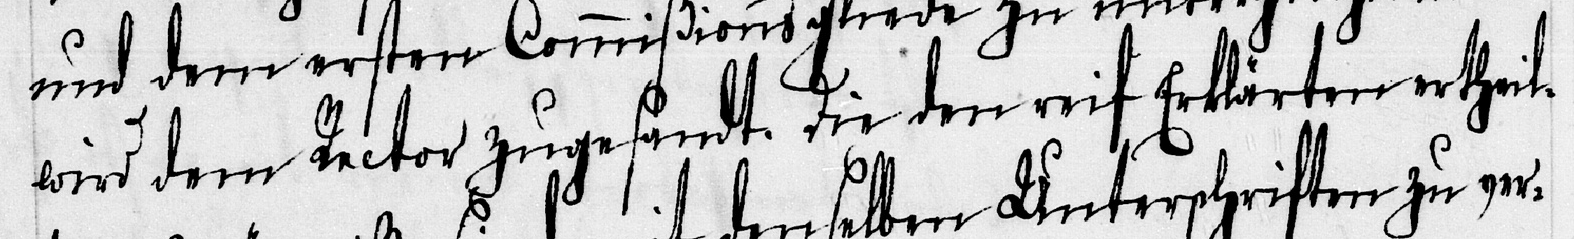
wird dem Rector zugesandt. Die den reif Erklärten erthei¬
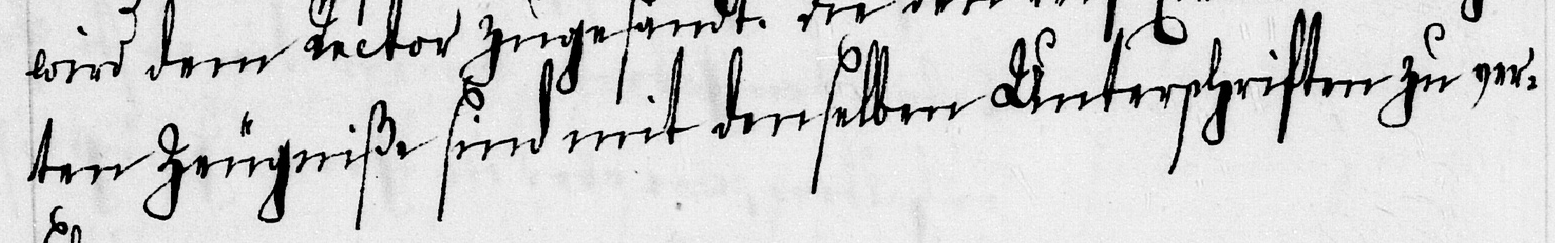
lten Zeugniße sind mit denselben Unterschriften zu ver¬
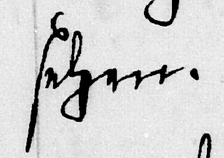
sehen.
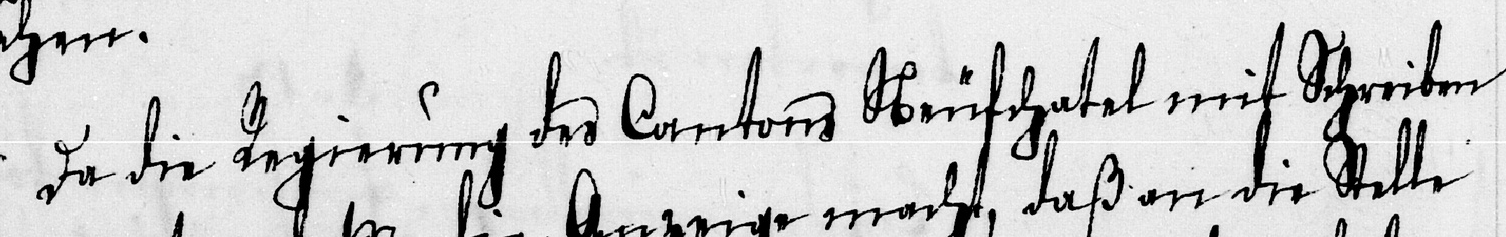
Da die Regierung des Cantons Neufchatel mit Schreiben
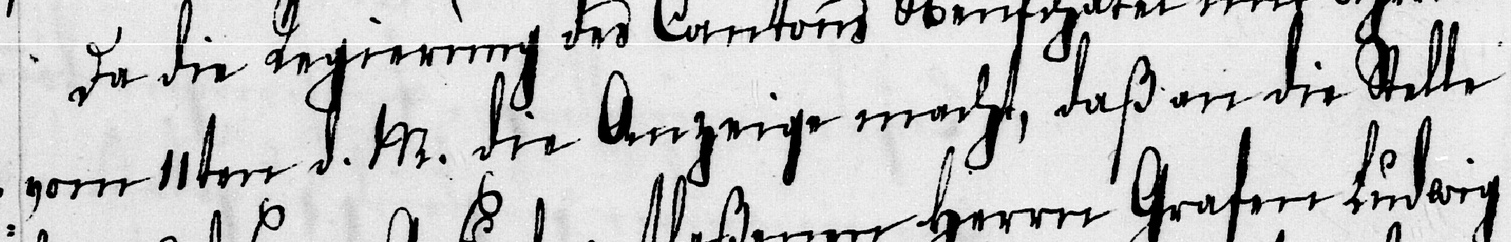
vom 11ten d. M. die Anzeige macht, daß an die Stelle
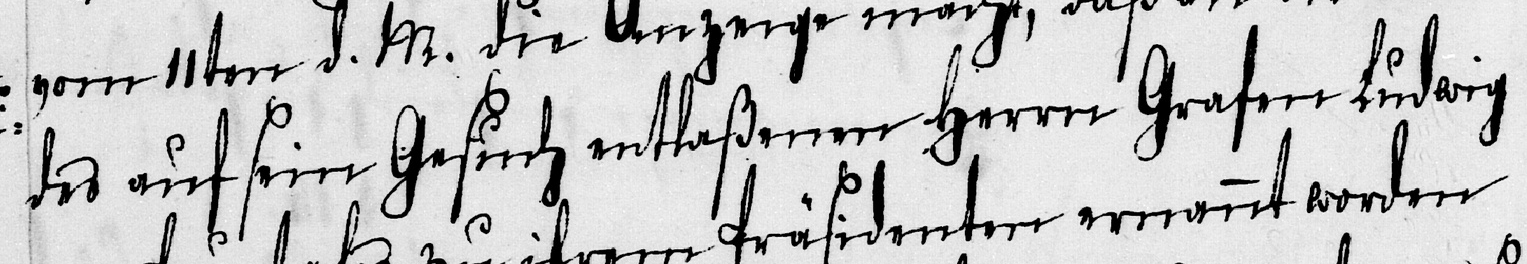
des auf sein Gesuch entlaßenen Herrn Grafen Ludwig
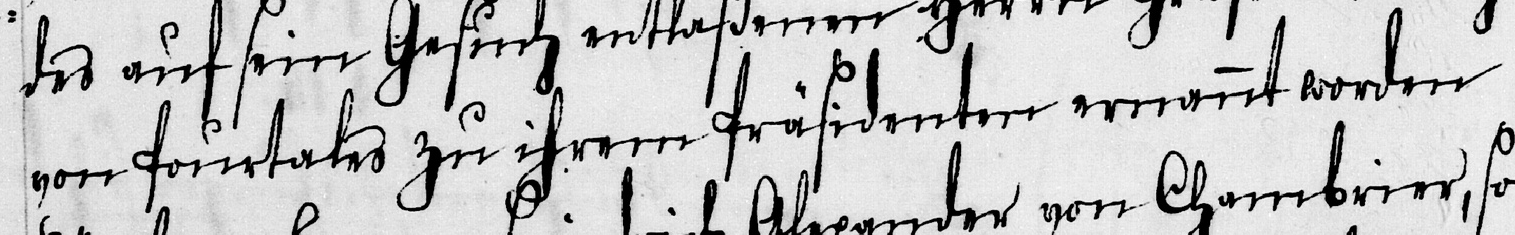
von Pourtales zu ihrem Präsidenten ernannt worden
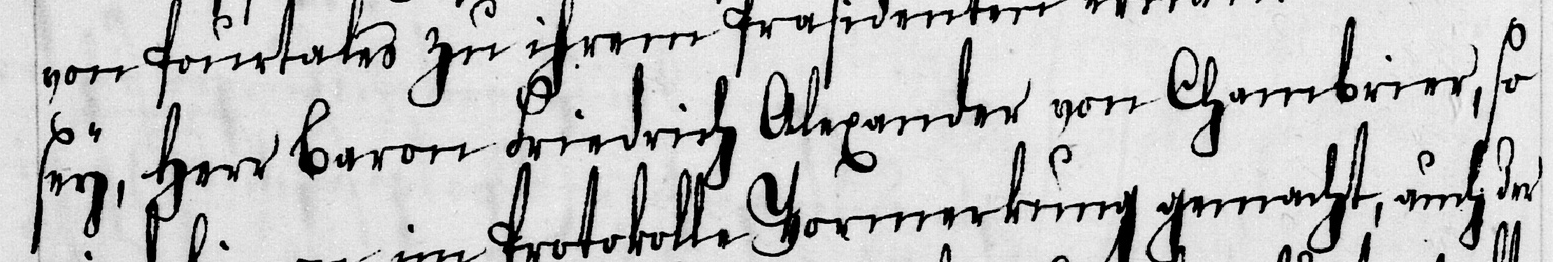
sey, Herr Baron Friedrich Alexander von Chambrier, so
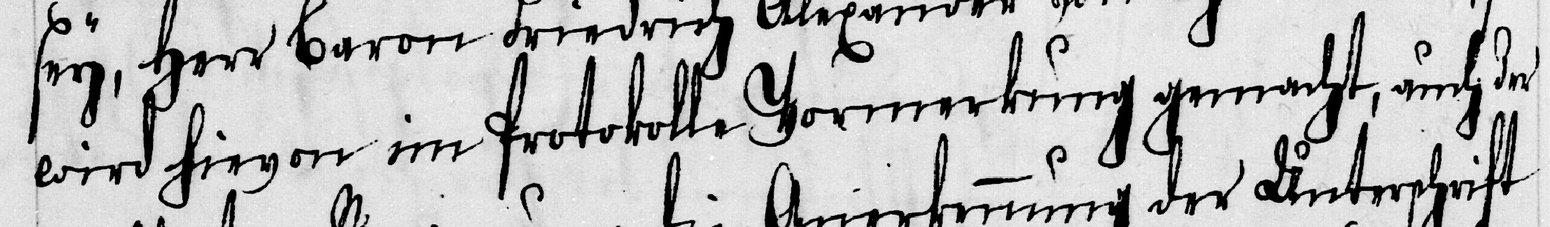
wird hiervon im Protokolle Vormerkung gemacht, auch
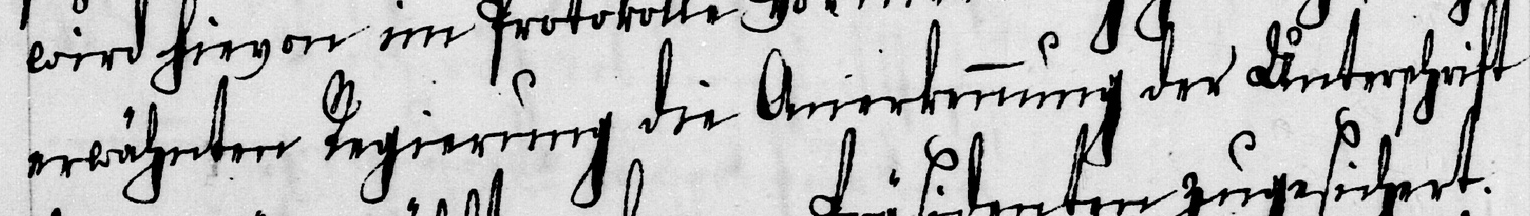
erwähnten Regierung die Anerkennung der Unterschrift
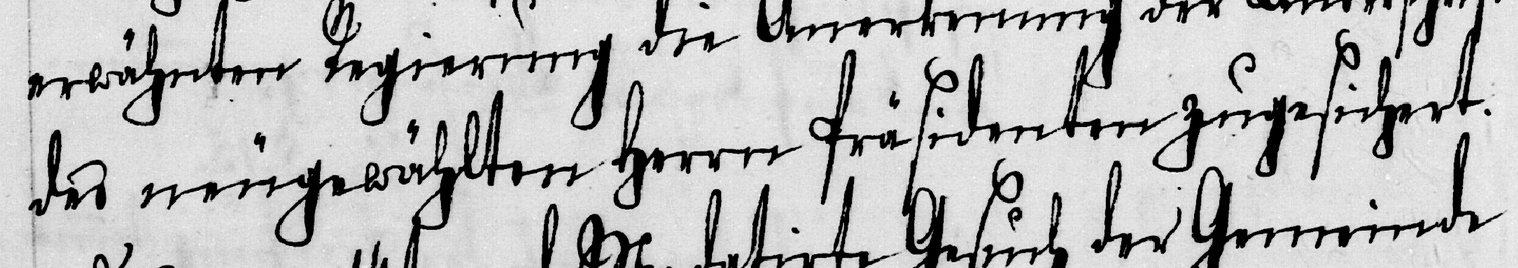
des neugewählten Herrn Präsidenten zugesichert.
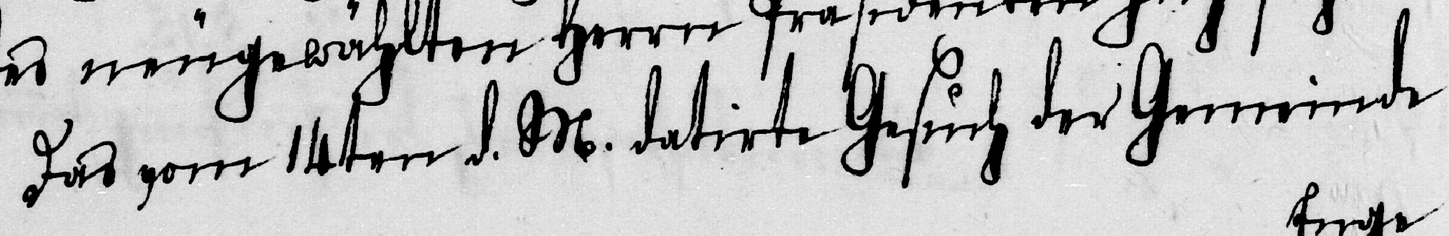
Das vom 14ten d. M. datirte Gesuch der Gemeinde
